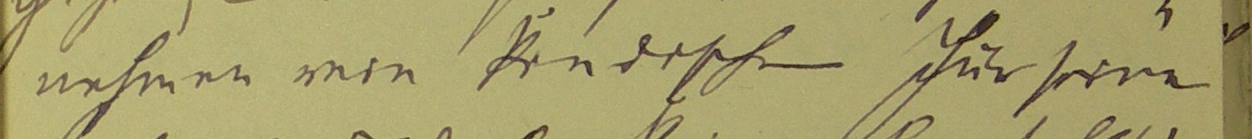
nehmen rein kindisch. Für seine
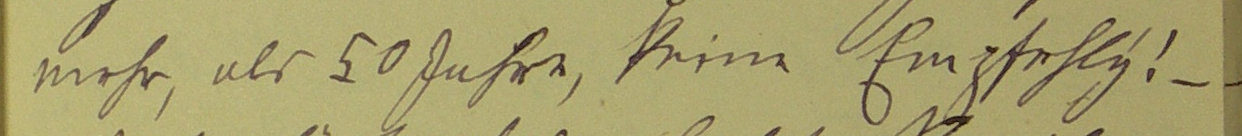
mehr, als 50 Jahre, kein Einstellung! -
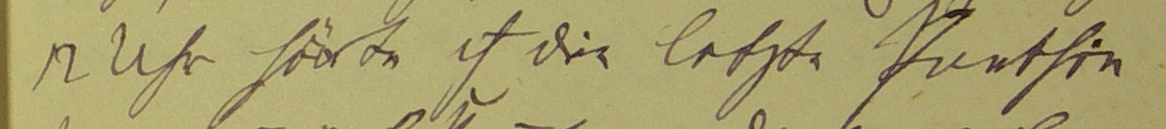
12 Uhr hörte ??? die letzte Parthie
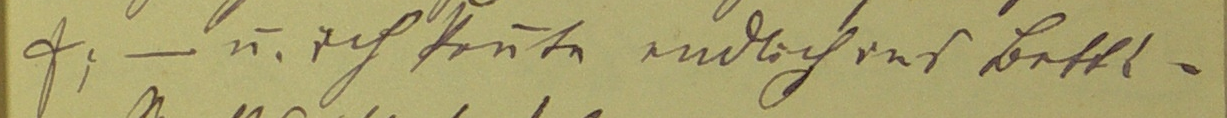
f; - u. ich konte endlich ins Bett ! -
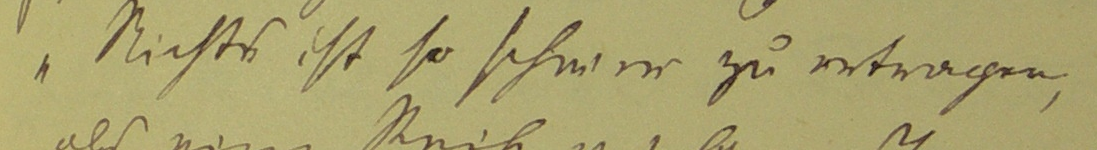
„ Nichts ist so schwer zu ertragen,
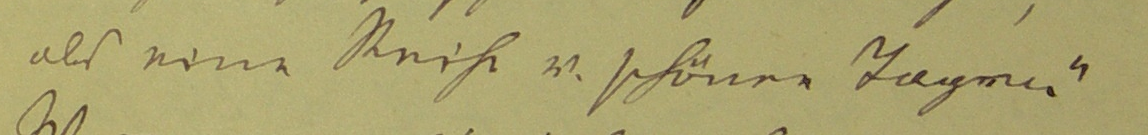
als eine Reihe v. schönen Tagen“
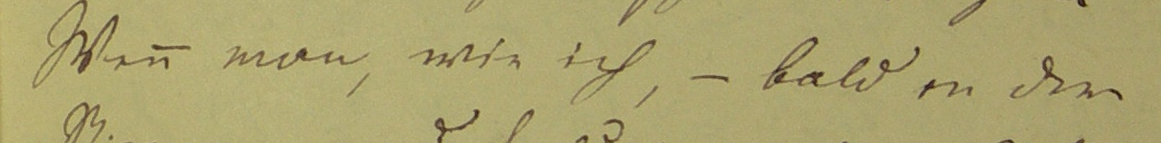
Wen man, wie ich, - bald in der
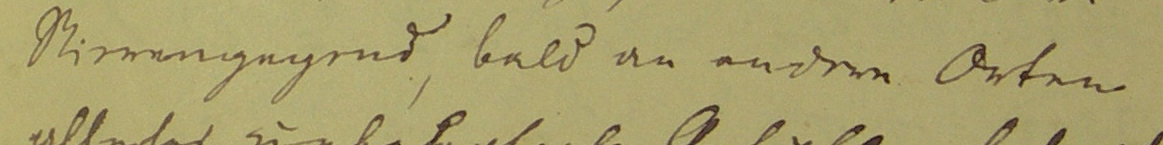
Nierengegend, bald an anderen Orten
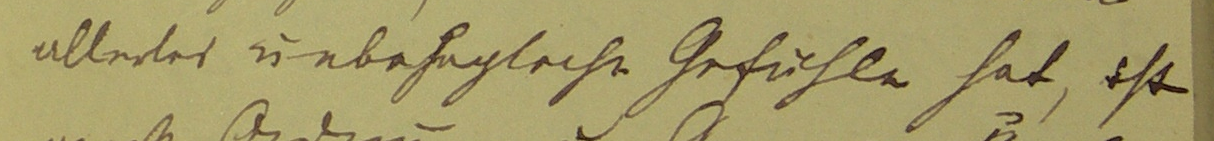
allerlei unbehagliche Gefühle hat, ist
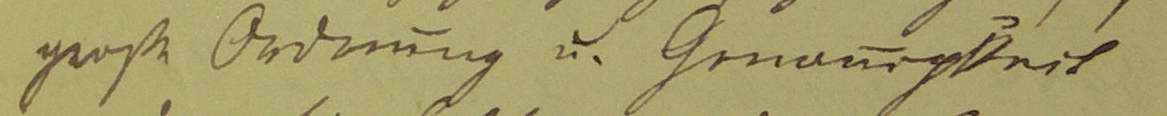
große Ordnung u. Genauigkeit
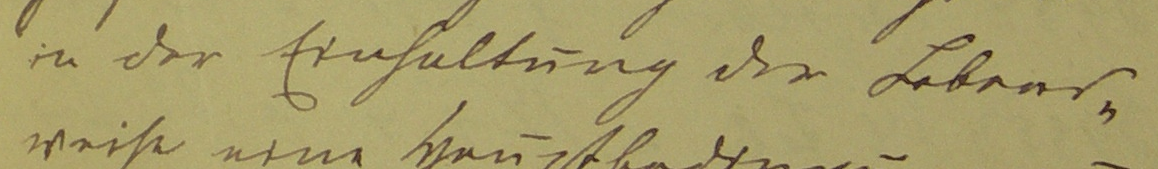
in der Einhaltung der Lebens¬
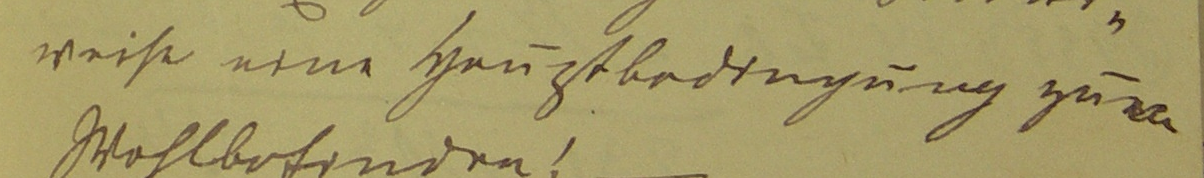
weise eine Hauptbedingung zum
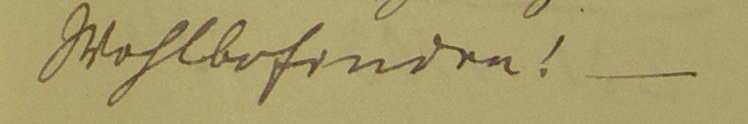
Wohlbefinden! -
